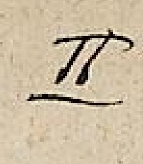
II
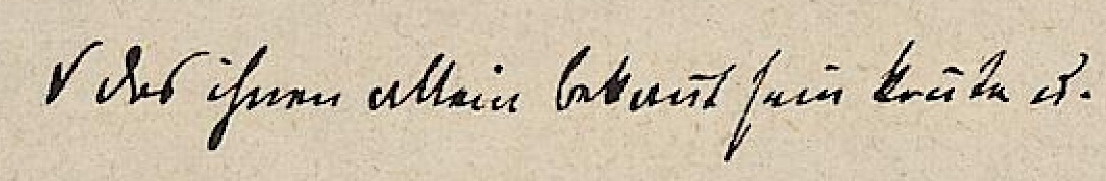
V das ihnen allein bekant sein konte u.
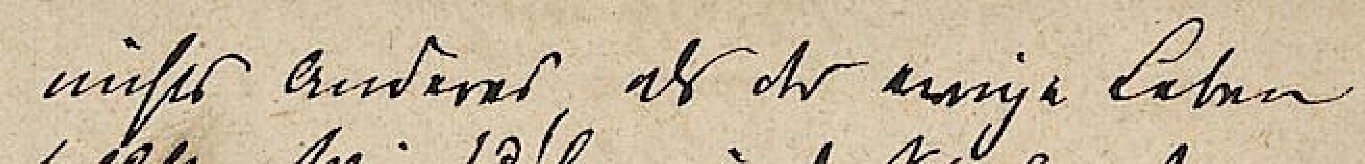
nichts anderes, als ds ewige Leben
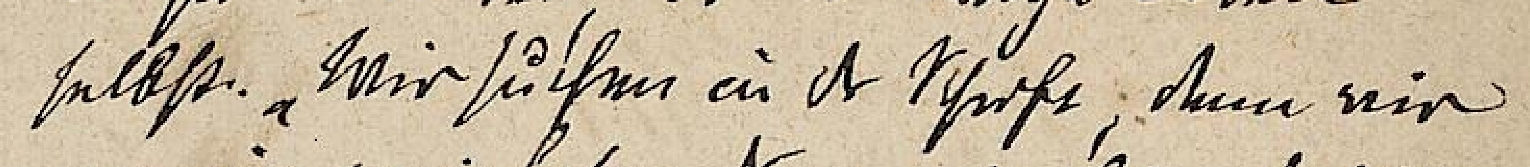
selbst. "Wir suchen in dr Schrift, denn wir
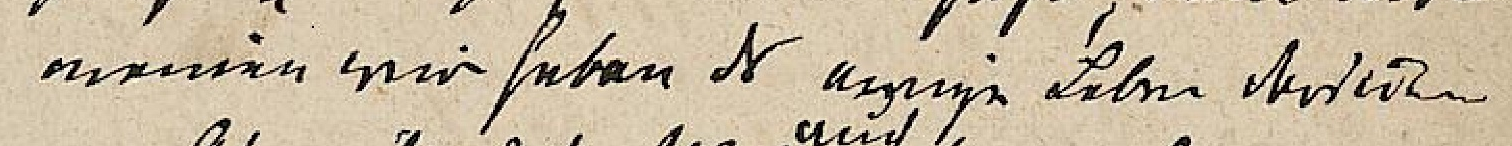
meinen wir seben ds ewige Leben darinen
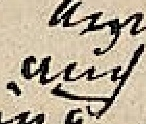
auch
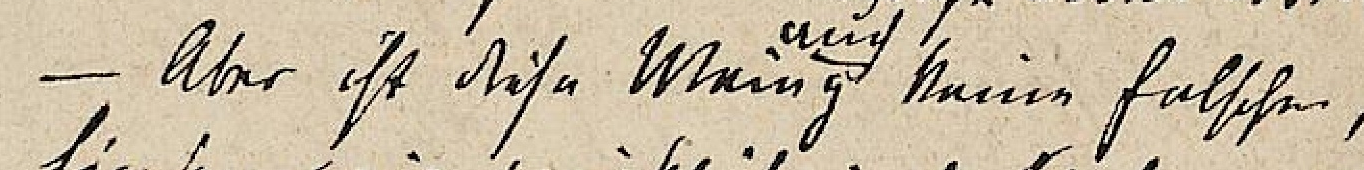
_ Aber ist diese Meing keine falschen,
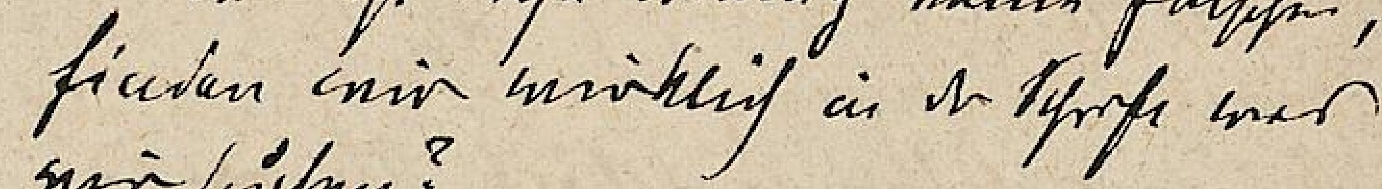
finden wir wirklich in dr Schraft was
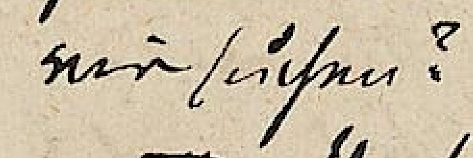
wir suchen?
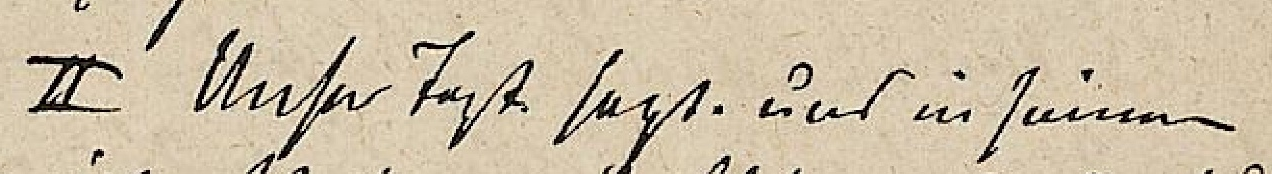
II Unser Text sagt. uns in seinen
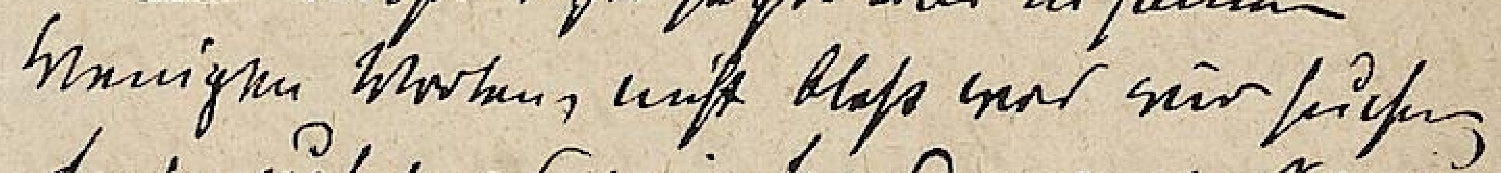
wenigen Worten, nicht bloß was wir suchen,
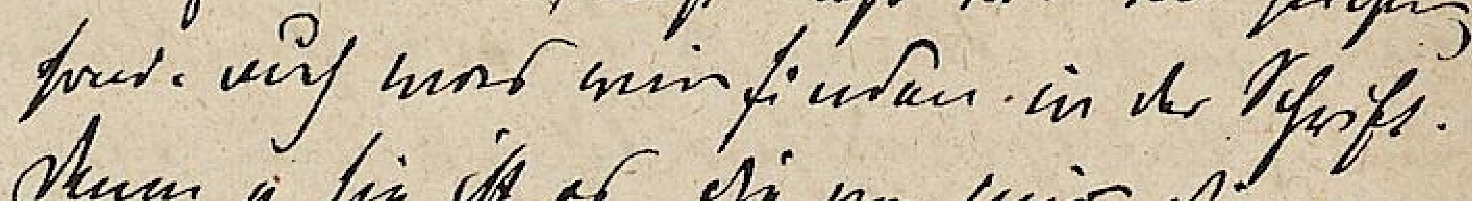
sond. auch was wir finden. in der Schrift.
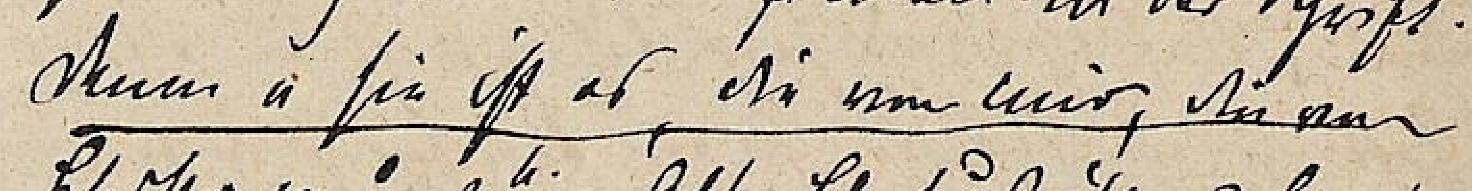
Denn sie ist es, die von mir, die von
